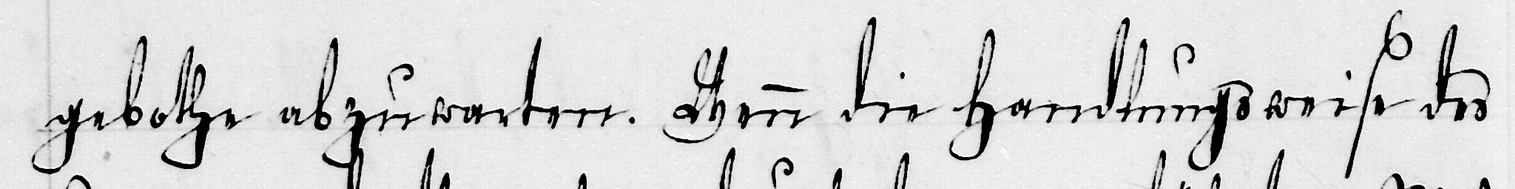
gebothe abzuwarten. Wenn die Handlungsweise des
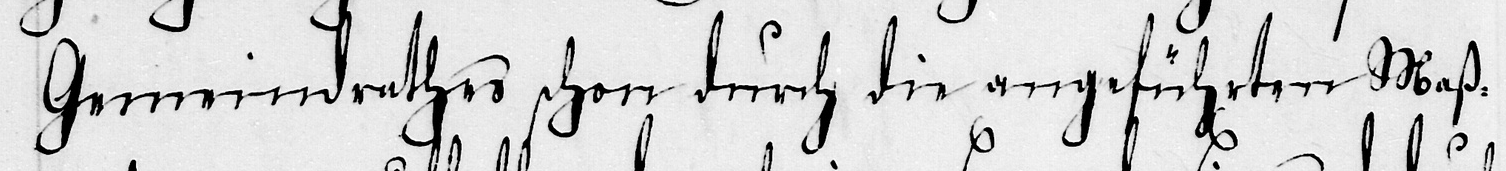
Gemeindrathes schon durch die angeführten Maß¬
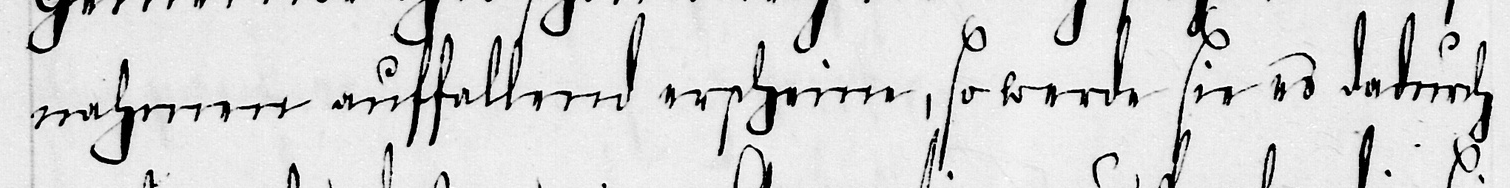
nahmen auffallend erscheine, so werde sie es dadurch
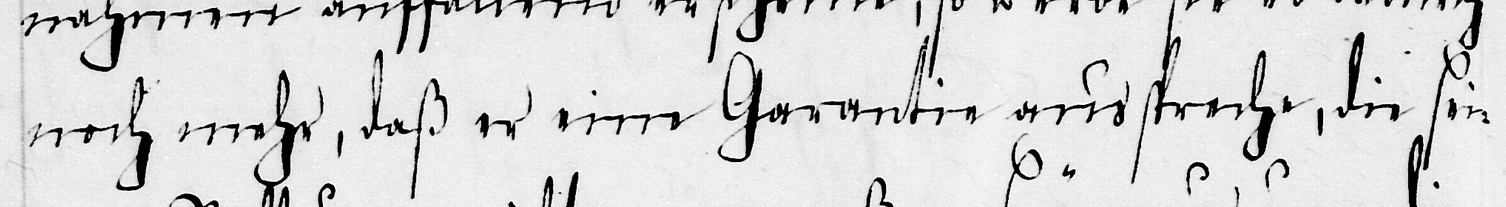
noch mehr, daß er eine Garantie ausspreche, die sei¬
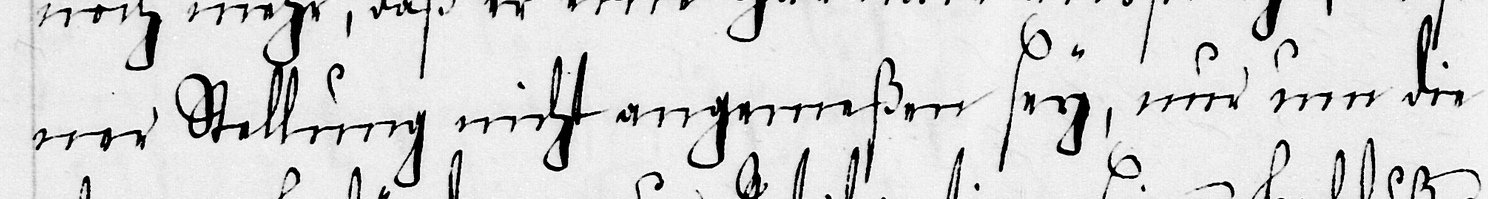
ner Stellung nicht angemeßen sey, nur um die
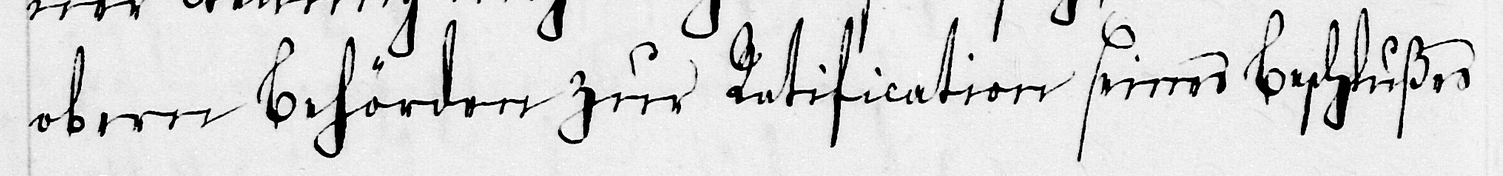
obern Behörden zur Ratification seines Beschlußes
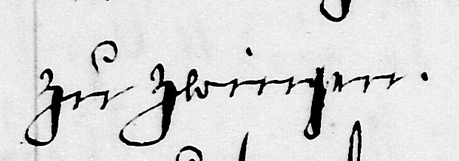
zu zwingen.
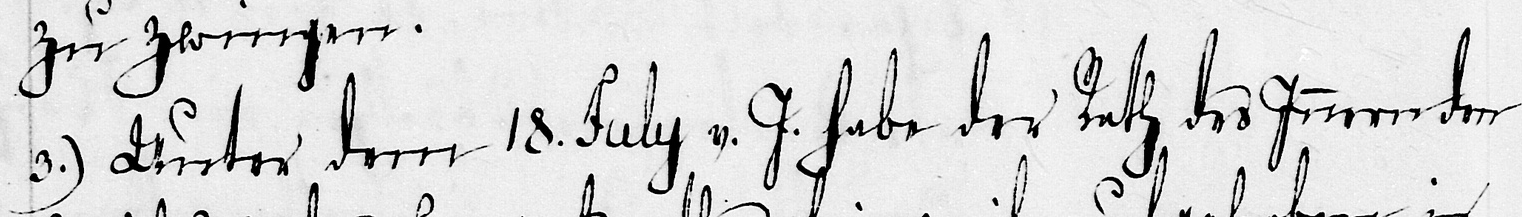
3.) Unter dem 18. July v. J. habe der Rath des Innern den
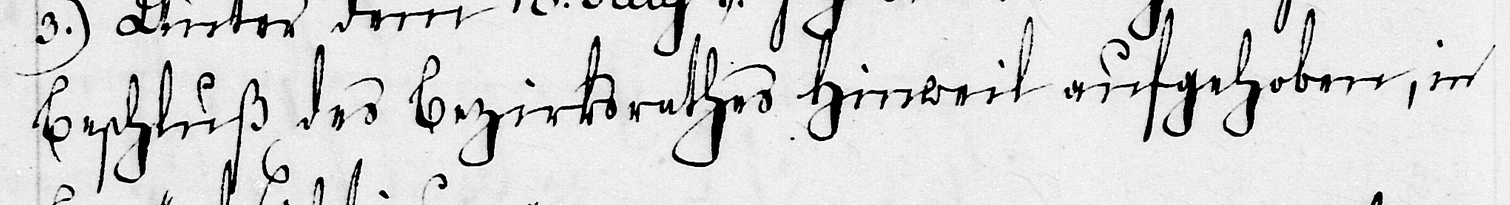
Beschluß des Bezirksrathes Hinweil aufgehoben, in
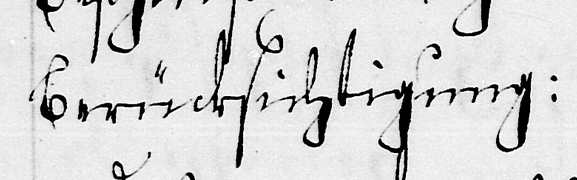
Berücksichtigung:
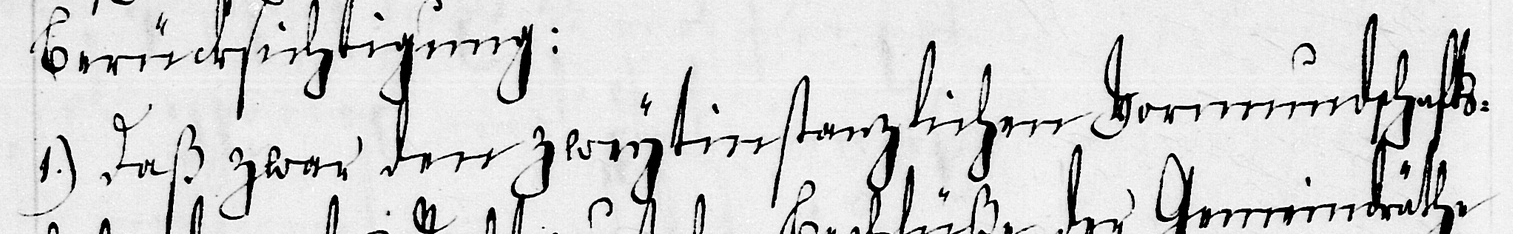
1.) Daß zwar den zweytinstanzlichen Vormundschafts¬
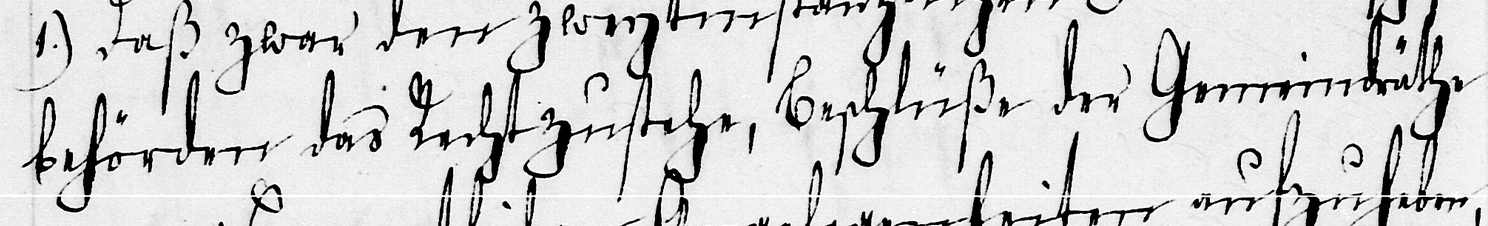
behörden das Recht zustehe, Beschlüße der Gemeindräthe
